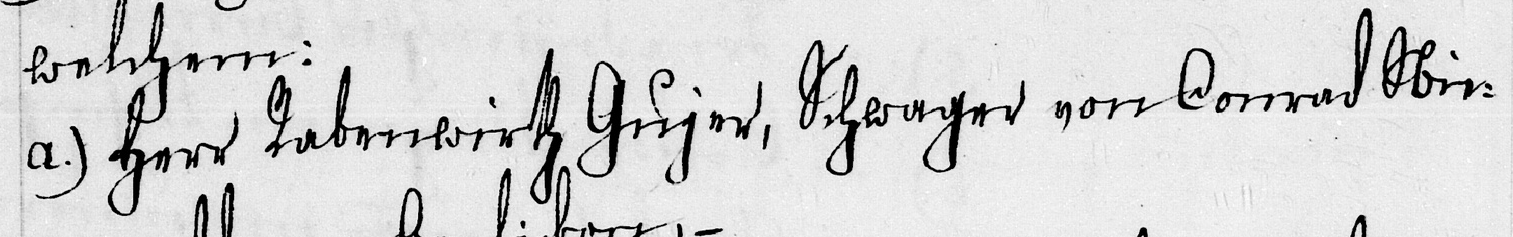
a.) Herr Rabenwirth Gujer, Schwager von Conrad Nie¬
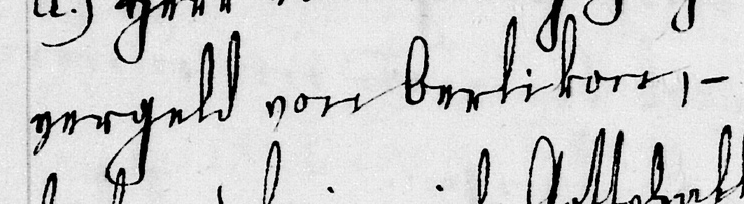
vergeld von Oerlikon, –
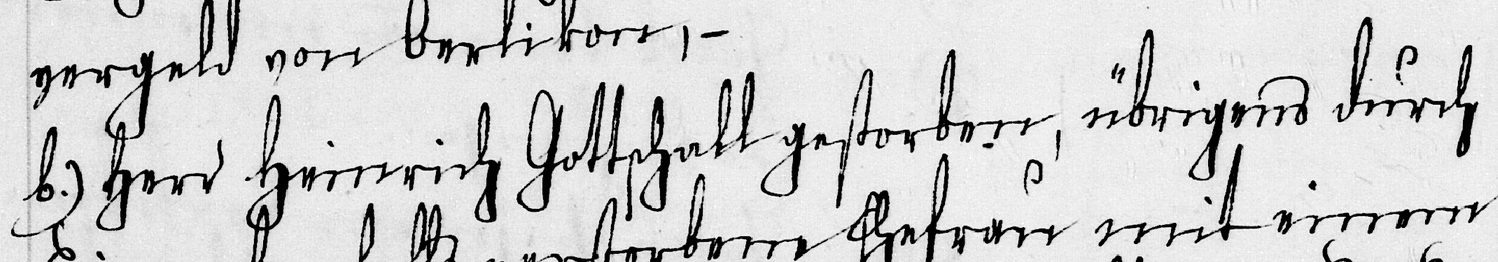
b.) Herr Heinrich Gottschall gestorben, übrigens durch
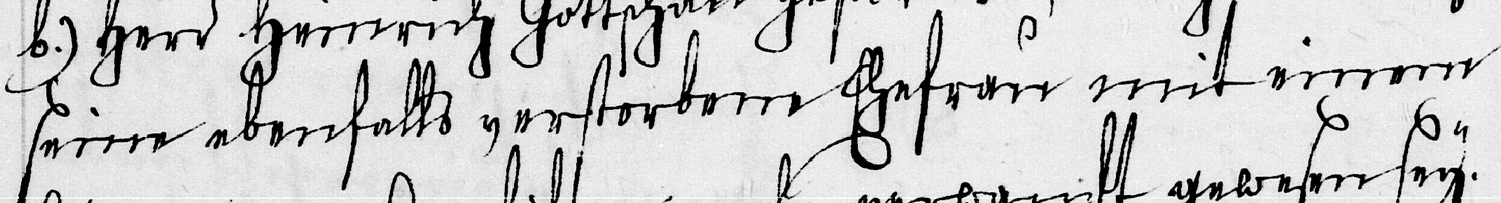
seine ebenfalls verstorbene Ehefrau mit einem
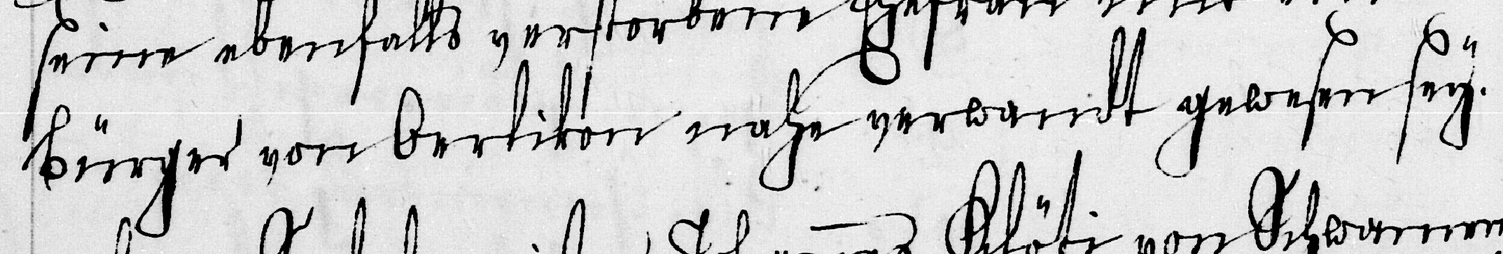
Bürger von Oerlikon nahe verwandt gewesen sey.
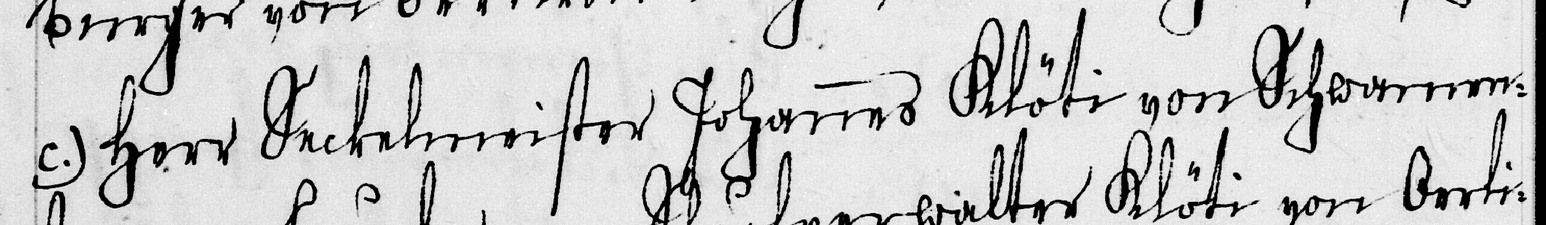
c.) Herr Seckelmeister Johannes Klöti von Schwamen¬
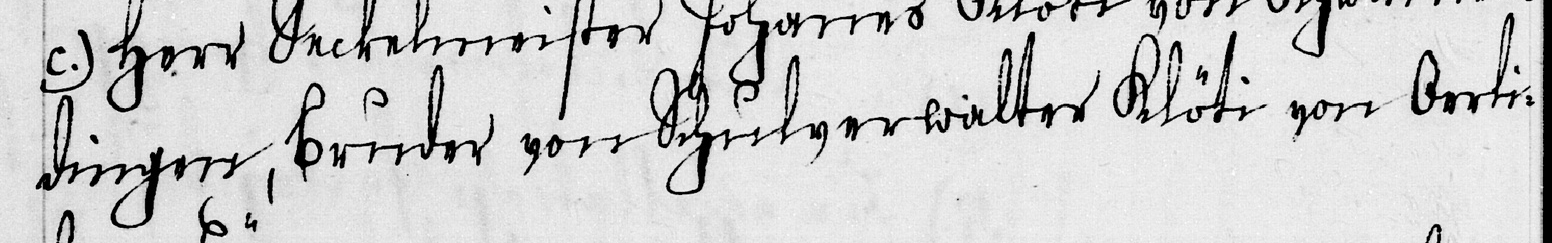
dingen, Bruder von Schulverwalter Klöti von Oerli¬
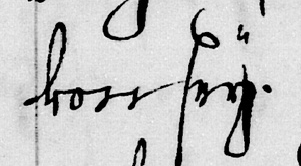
kon sey.
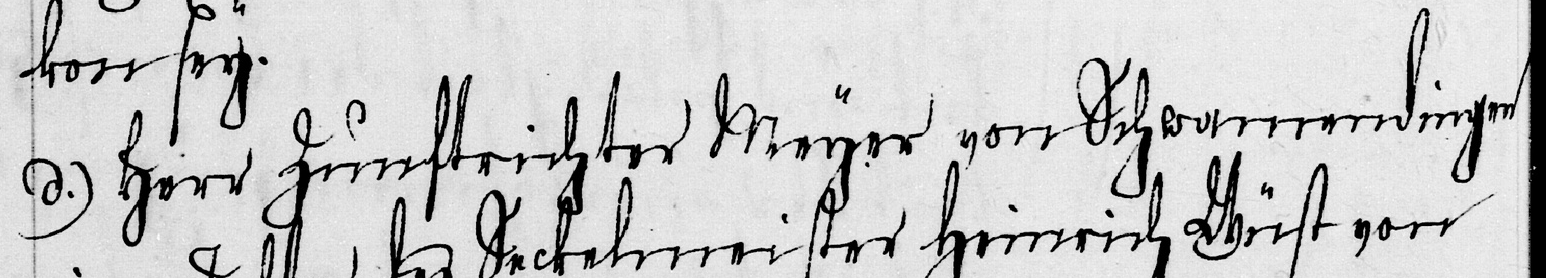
d.) Herr Zunftrichter Meyer von Schwamendingen
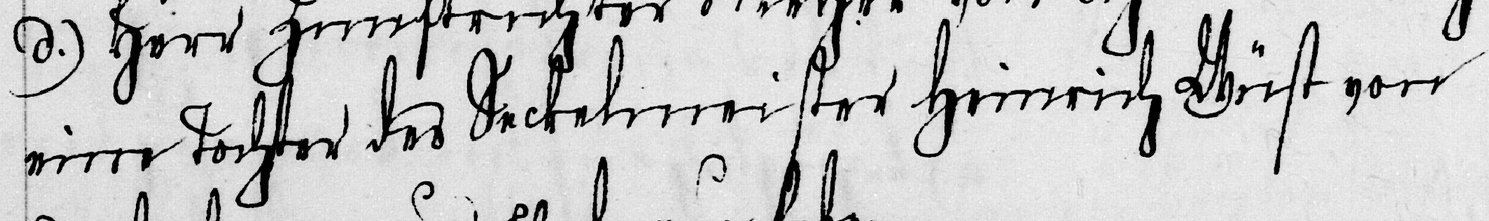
eine Tochter des Seckelmeister Heinrich Wüst von
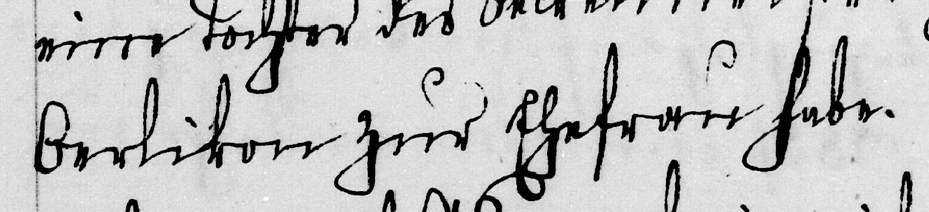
Oerlikon zur Ehefrau habe.
